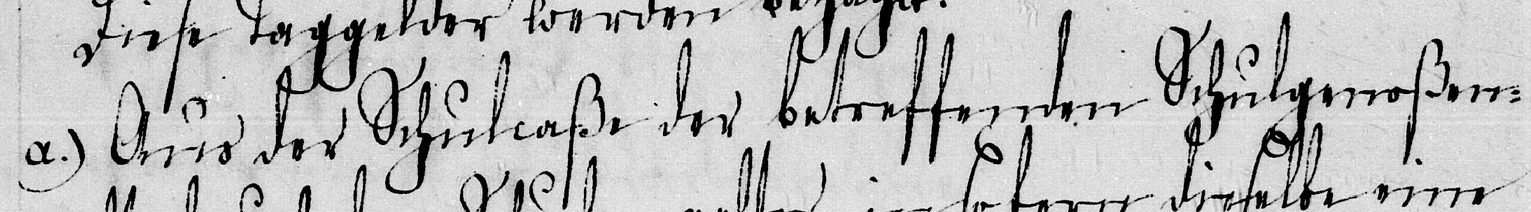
a.) Aus der Schulcaße der betreffenden Schulgenoßen¬
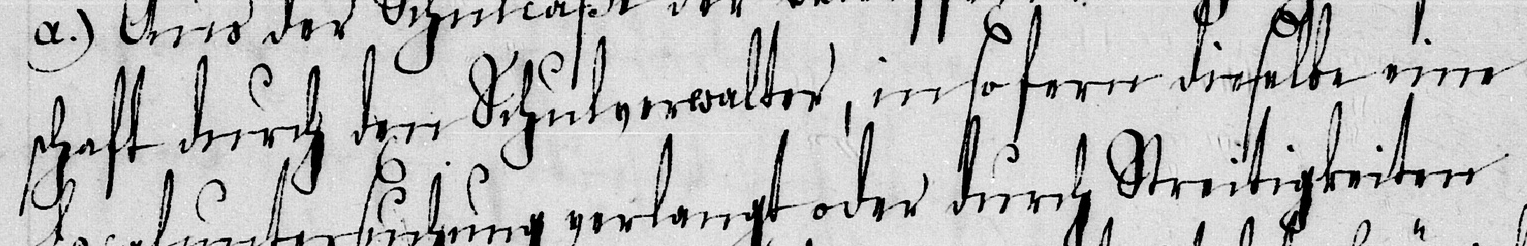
schaft durch den Schulverwalter, insofern dieselbe eine
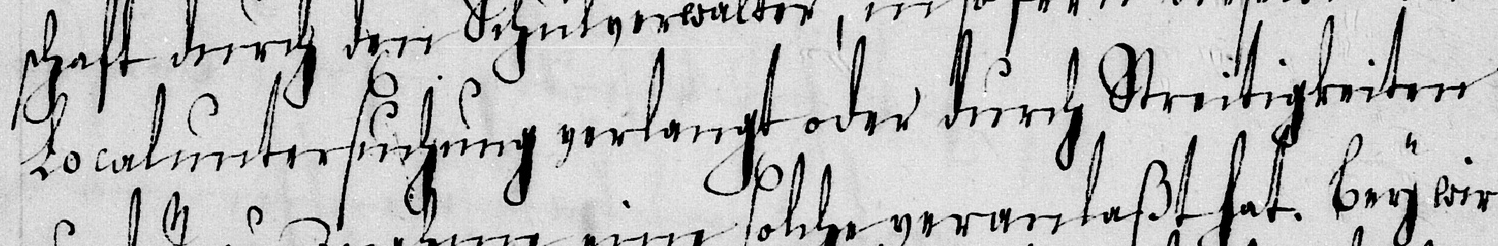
Localuntersuchung verlangt oder durch Streitigkeiten
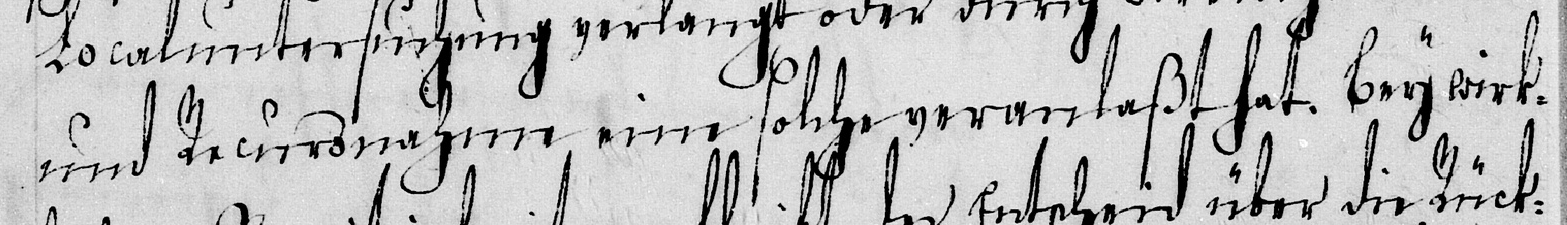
und Recursnahme eine solche veranlaßt hat. Bey wirk¬
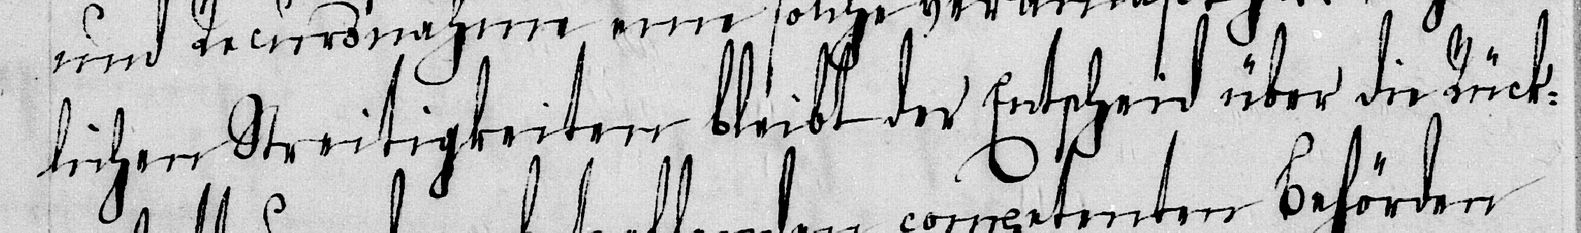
lichen Streitigkeiten bleibt der Entscheid über die Rück¬
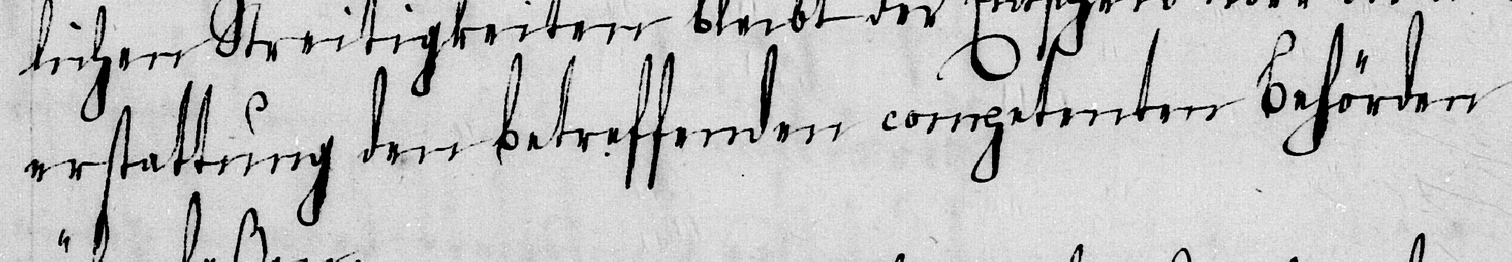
erstattung den betreffenden competenten Behörden
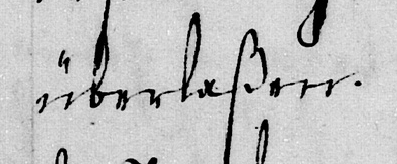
überlaßen.
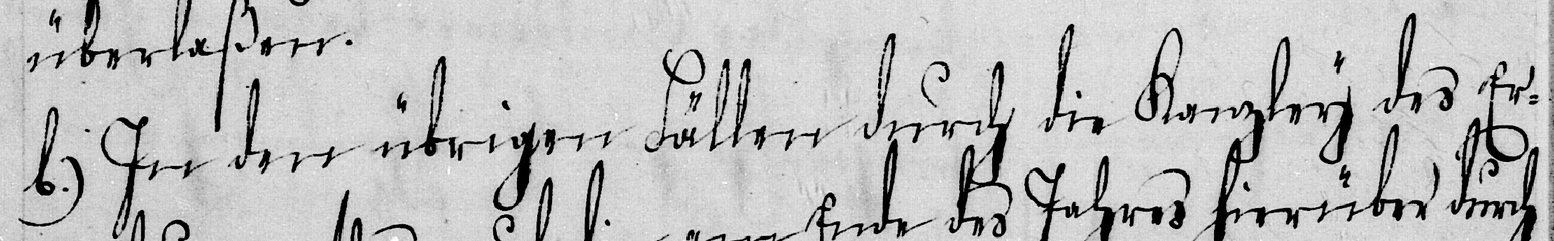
b.) In den übrigen Fällen durch die Kanzley des Er¬
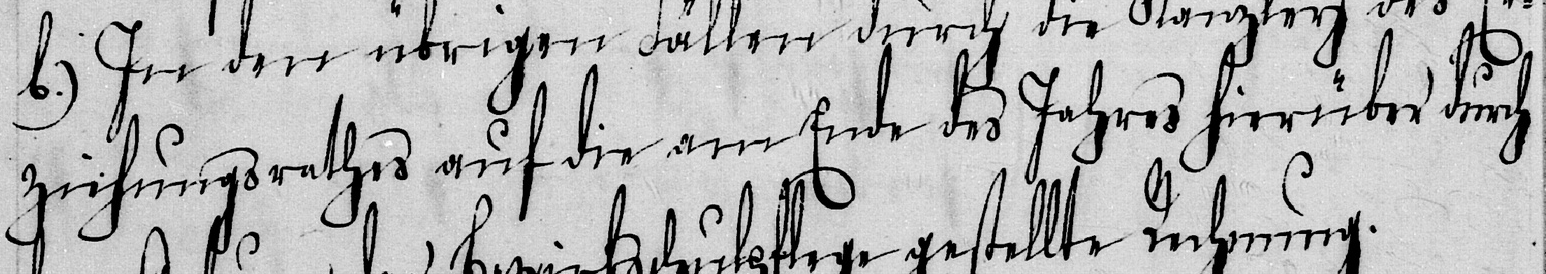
ziehungsrathes auf die am Ende des Jahres hierüber durch
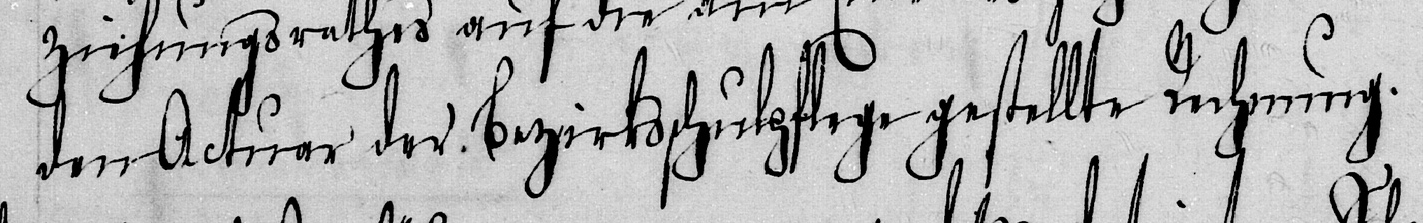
den Actuar der Bezirksschulpflege gestellte Rechnung.
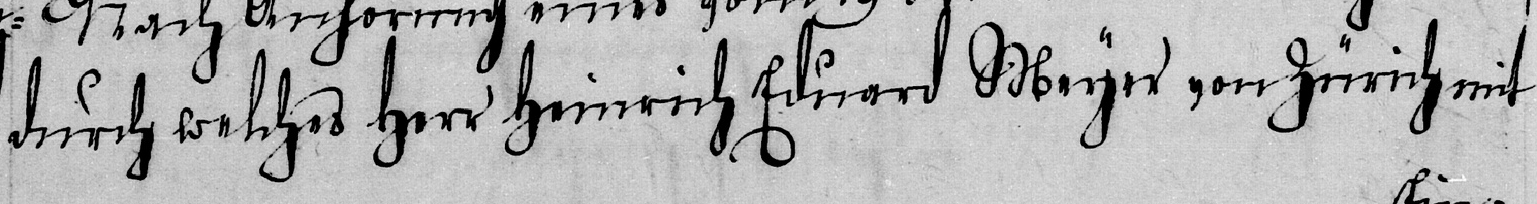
durch welches Herr Heinrich Eduard Meyer von Zürich mit
